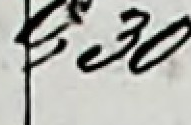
0,30
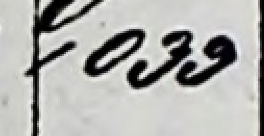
0,033
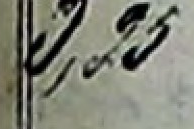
3,25
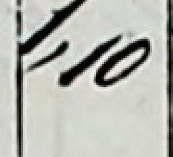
1,10
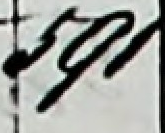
591
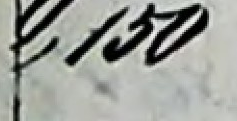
0,150
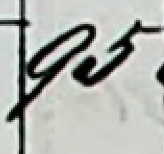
95
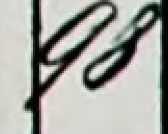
98
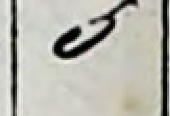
5
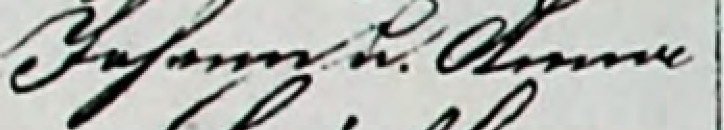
Johann u. Anna
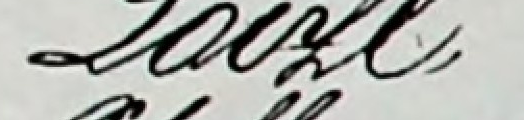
Loizl
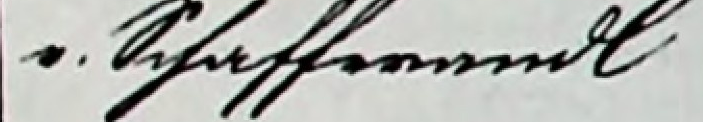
v. Schafferandl
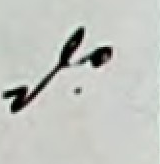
do
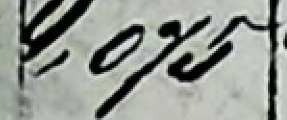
0,075
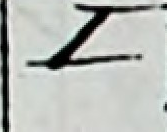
I
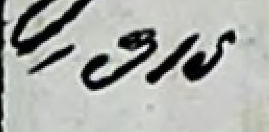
0,315
